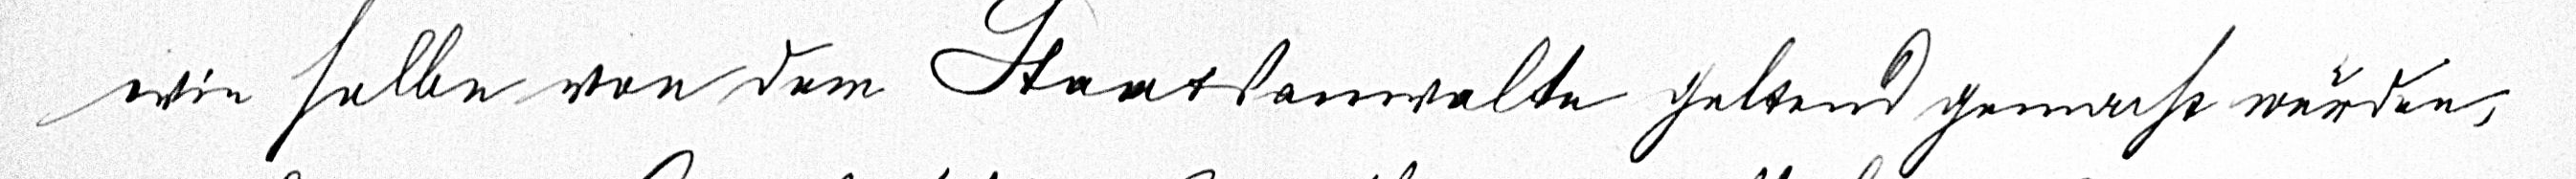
wie selbe von dem Staatsanwalte geltend gemacht wurden,
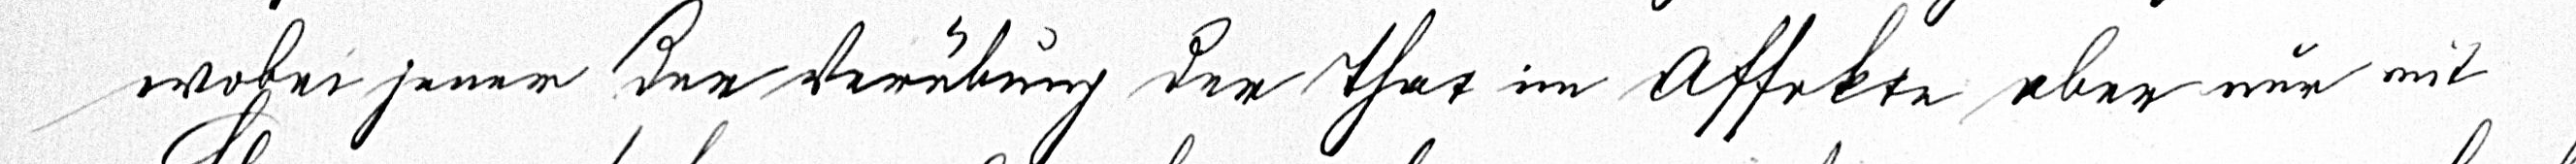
wobei jener den Verübung der That im Affekte aber nur mit
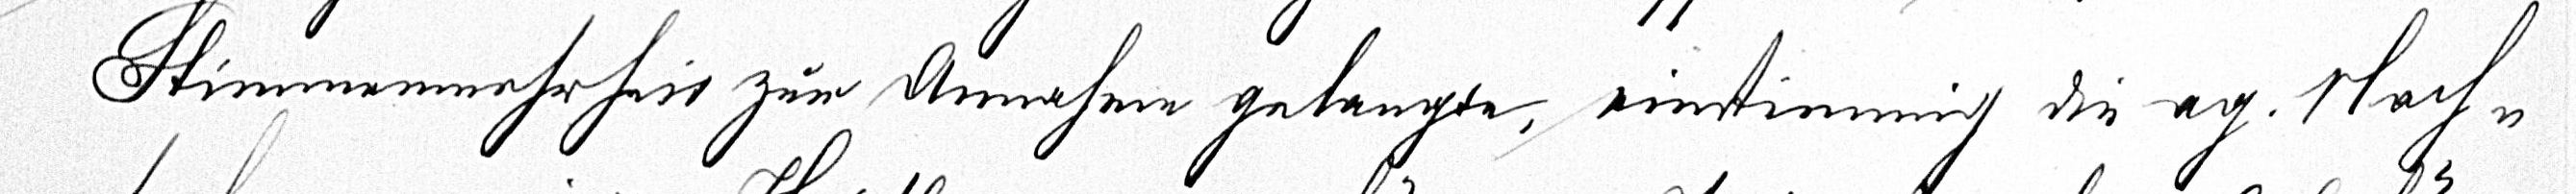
Stimmenmehrheit zur Annahme gelangte, einstimmig die ag. Nach¬
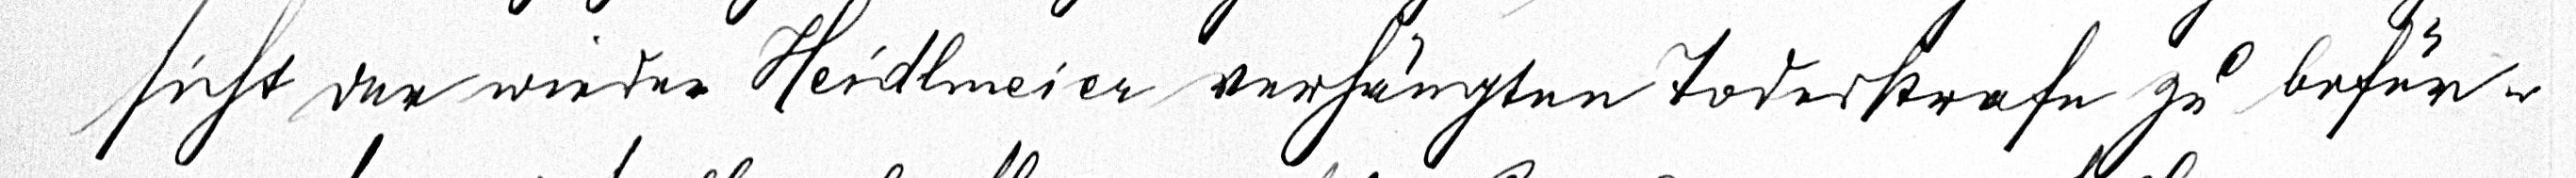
sicht der wieder Heidlmeier verhängten Todesstrafe zu befür¬
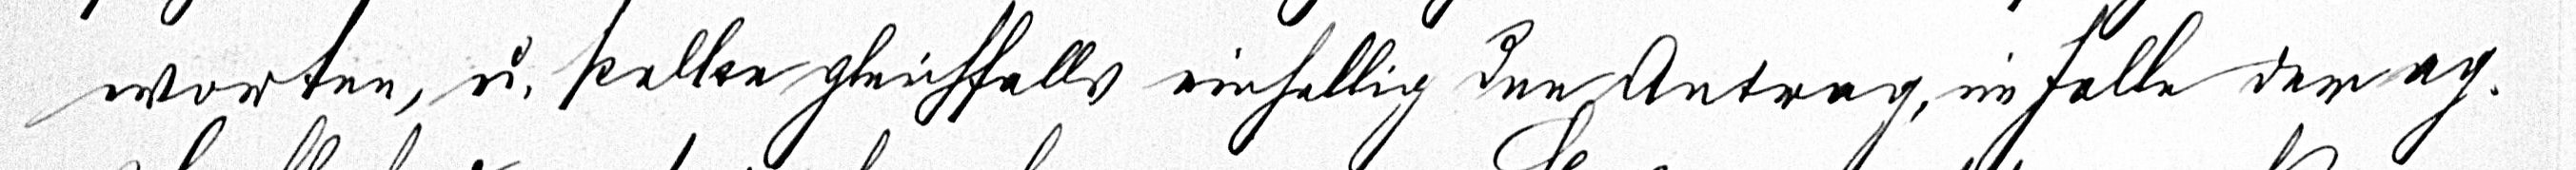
worten, u. stellte gleichfalls einhellig den Antrag, im Felle der ag.
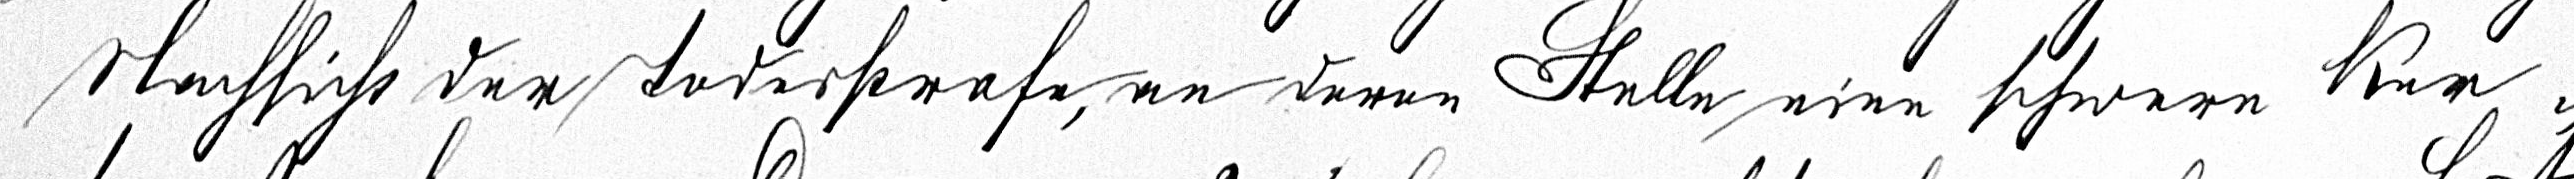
Nachsicht der Todesstrafe, an deren Stelle eine schwere Ker¬
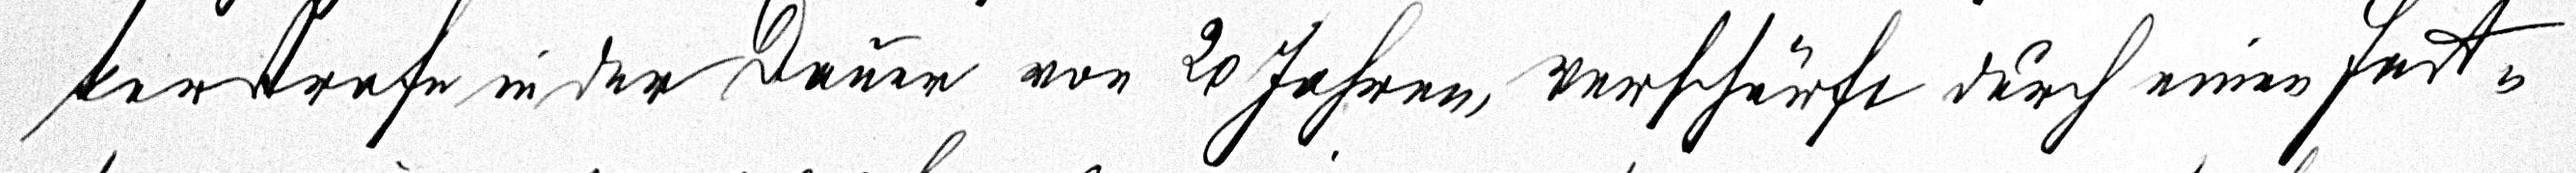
kerstrafe in der Dauer von 20 Jahren, verschürft durch einen Fast¬
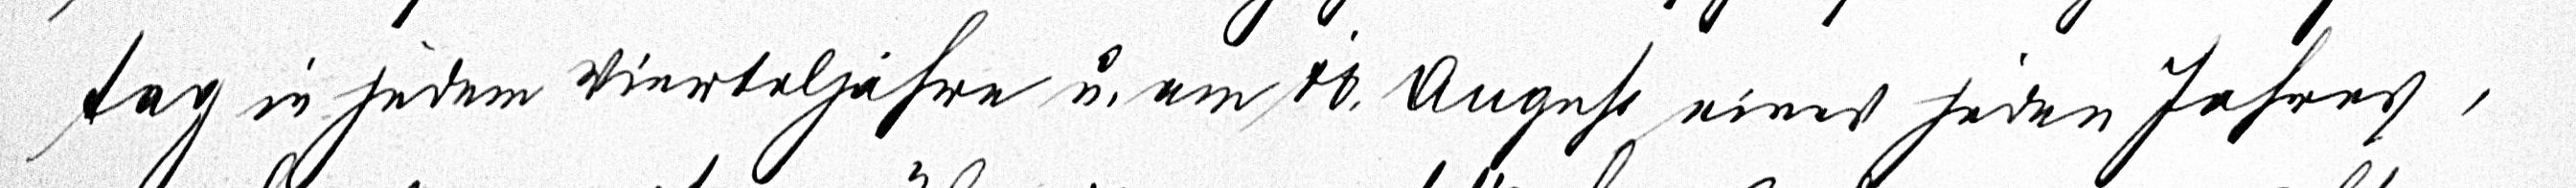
tag in jedem vierteljahre u. am 10. August eines jeden Jahres,
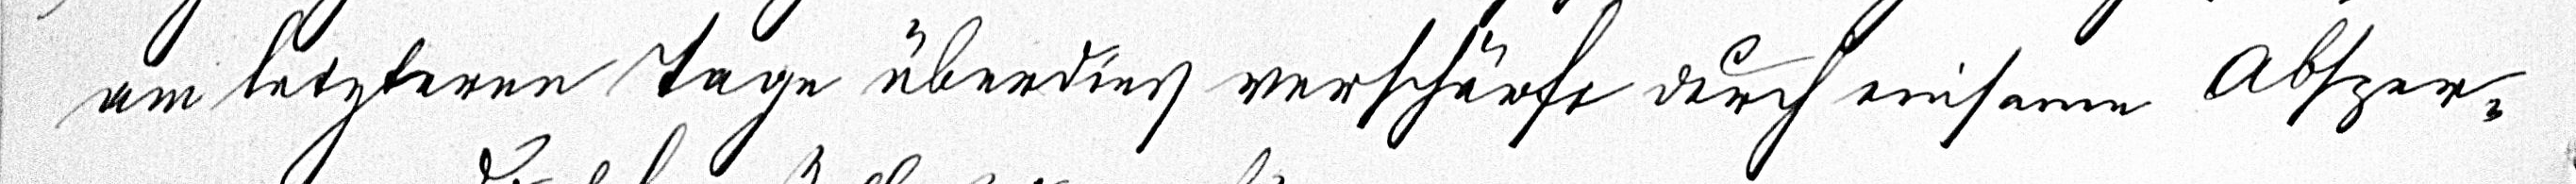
am letzteren Tage überdies verschürft durch einsame Absper¬
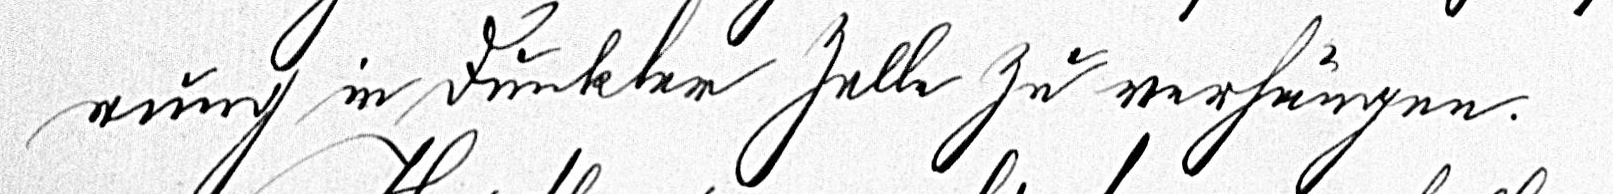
rung in Dunkler Zelle zu verhängen.
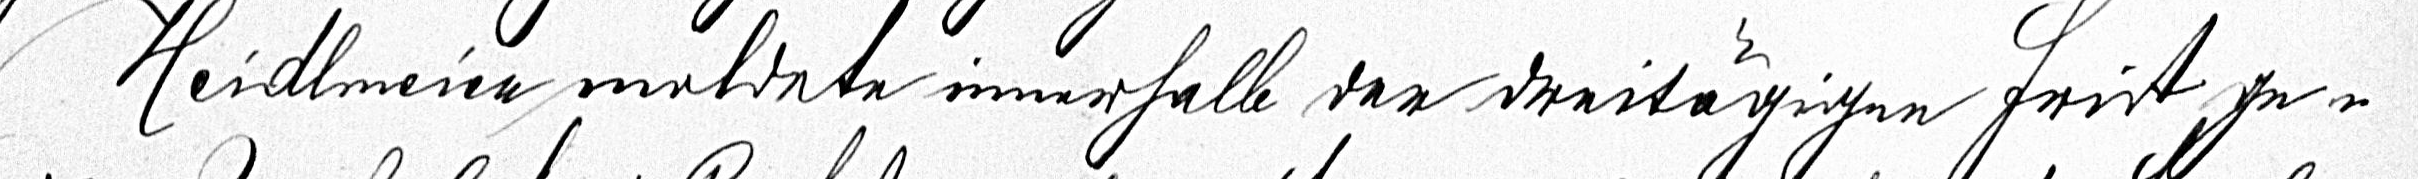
Heidlmeier meldete innerhalb der Dreitägigen Frxx ge¬
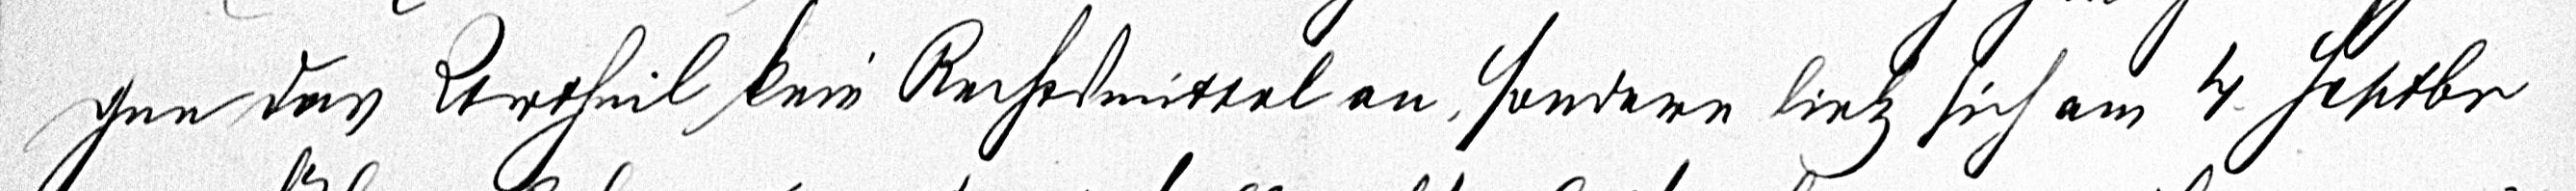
gen das Urtheil kein Rechtsmittel an, sondere ließ sich am 4. Septbr
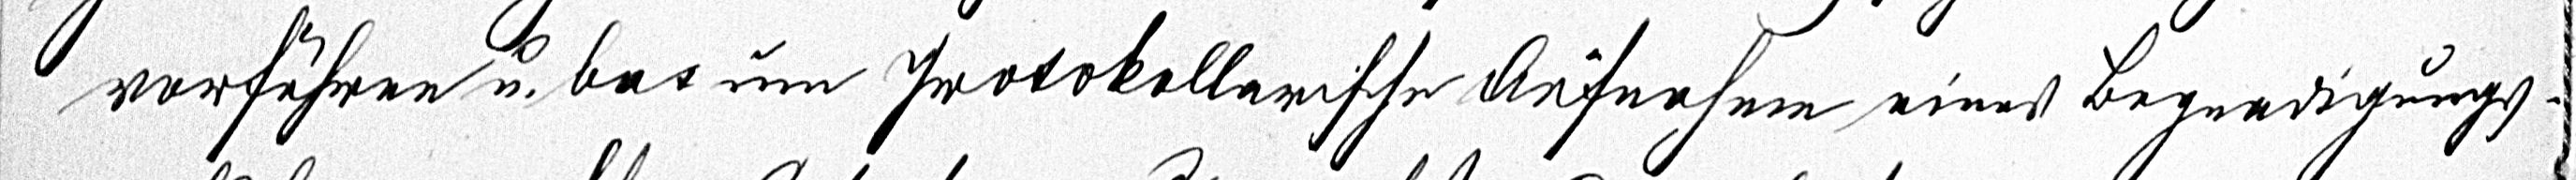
vorführen u. bat um Protokollarische Aufnehme eines Begradigungs¬
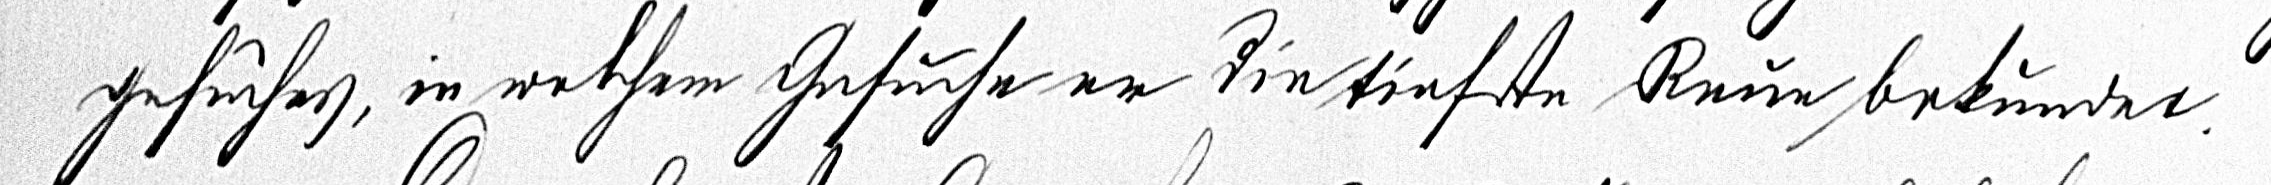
gesuches, in welchem Gesuche er die tiefste Reue bekundet.
